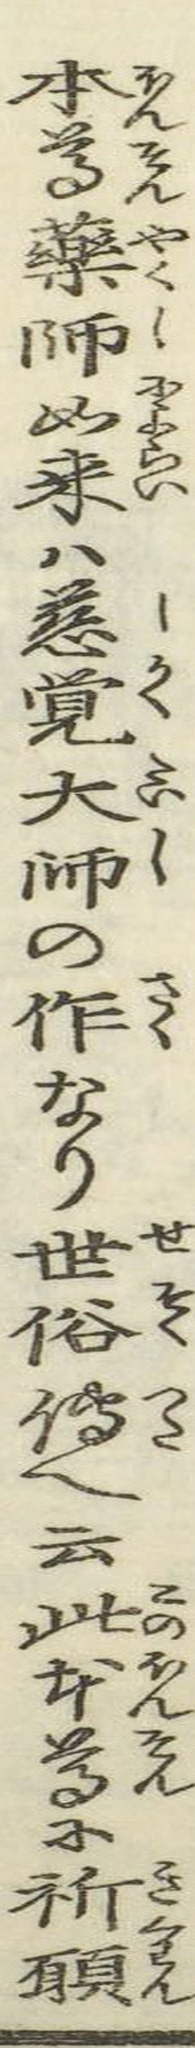本尊藥師如来は慈覚大師の作なり世俗傳へ云此本尊に祈願
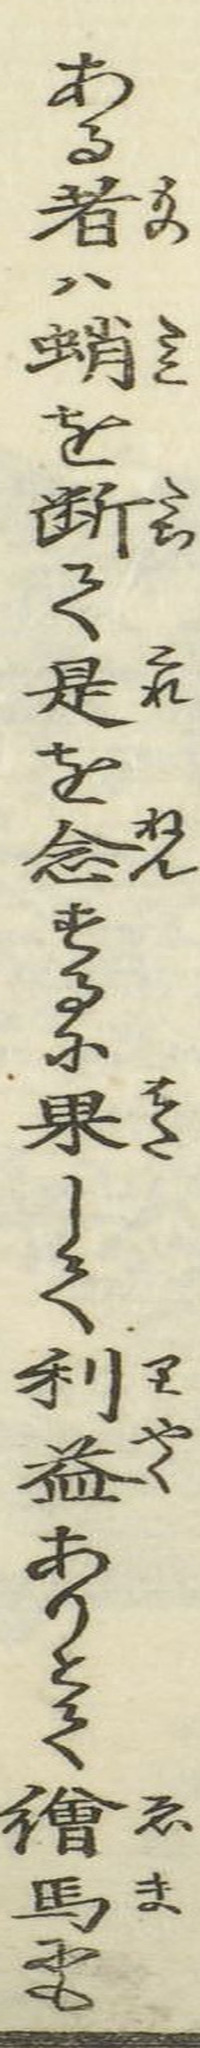ある者は蛸を断て是を念するに果して利益ありとて繪馬にも
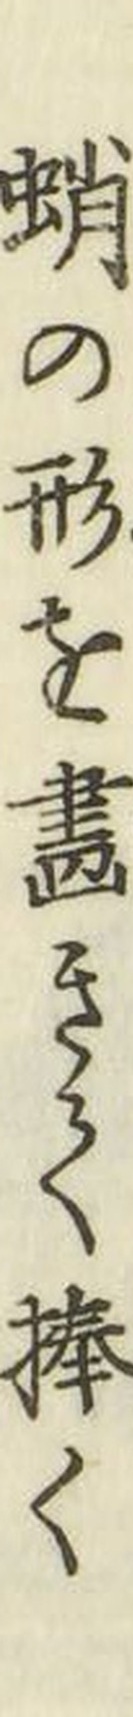蛸の形を畵きて捧く
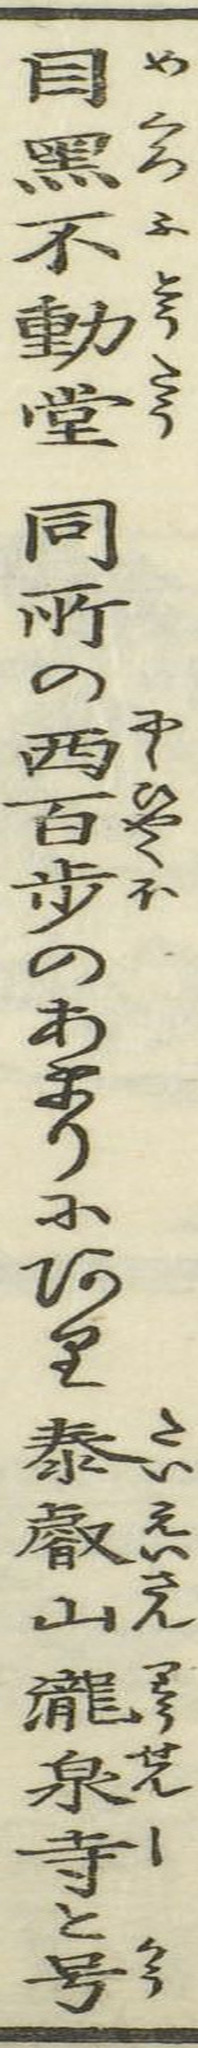目黑不動堂同所の西百歩のあまりにあり泰叡山瀧泉寺と号
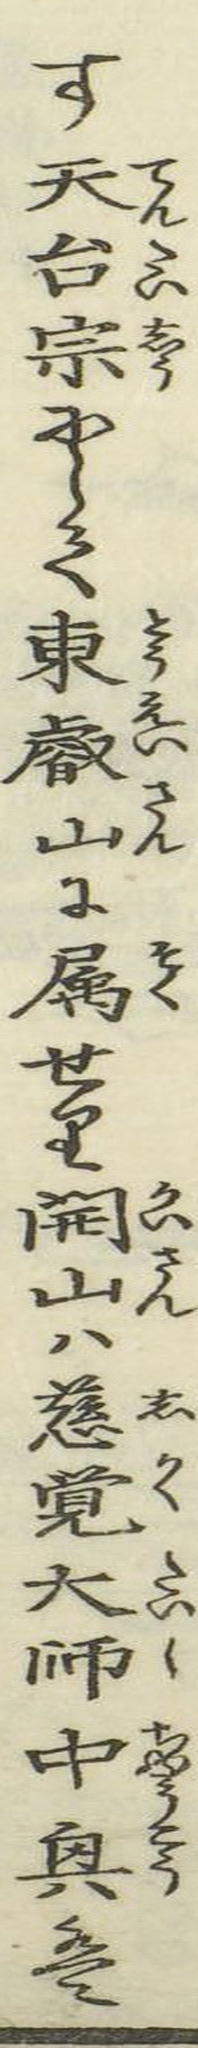す天台宗にして東叡山に属せり開山は慈覚大師中興は
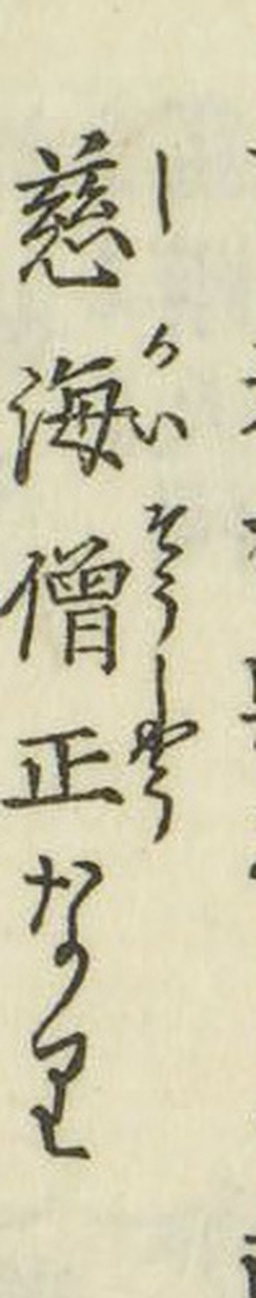慈海僧正なり
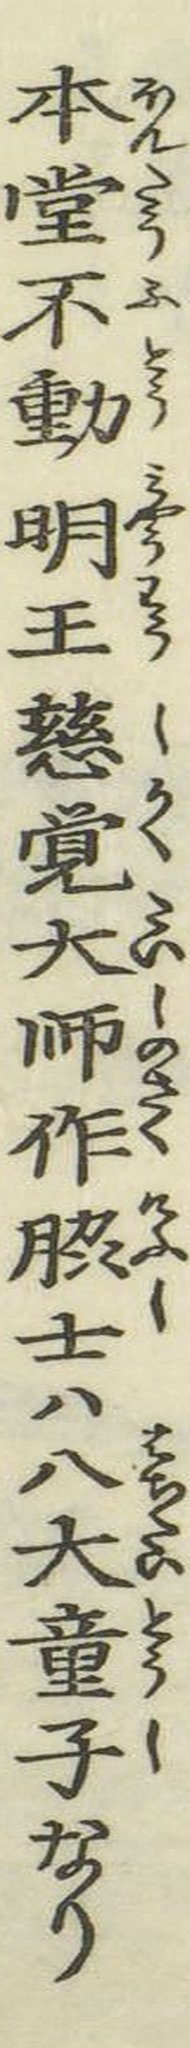本堂不動明王慈覚大師作脇士は八大童子なり
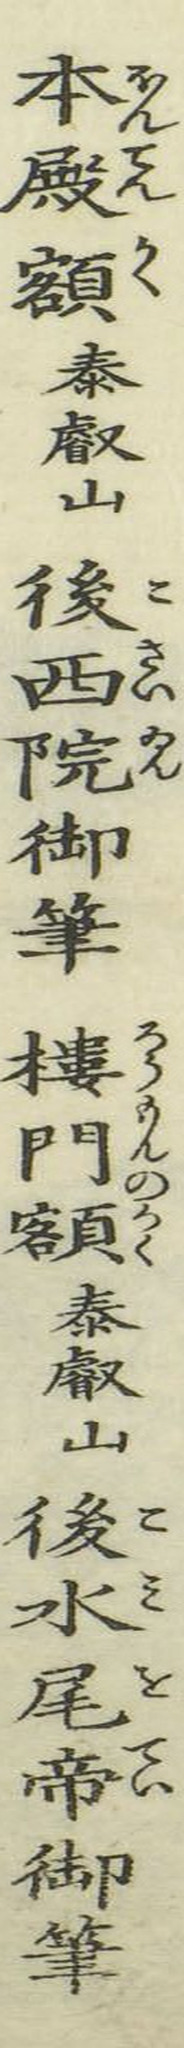本殿額泰叡山後西院御筆樓門額泰叡山後水尾帝御筆

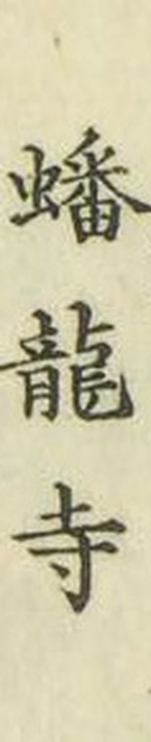蟠龍寺
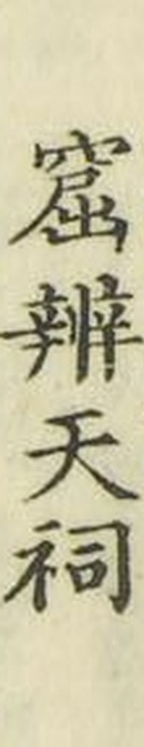窟辨天祠

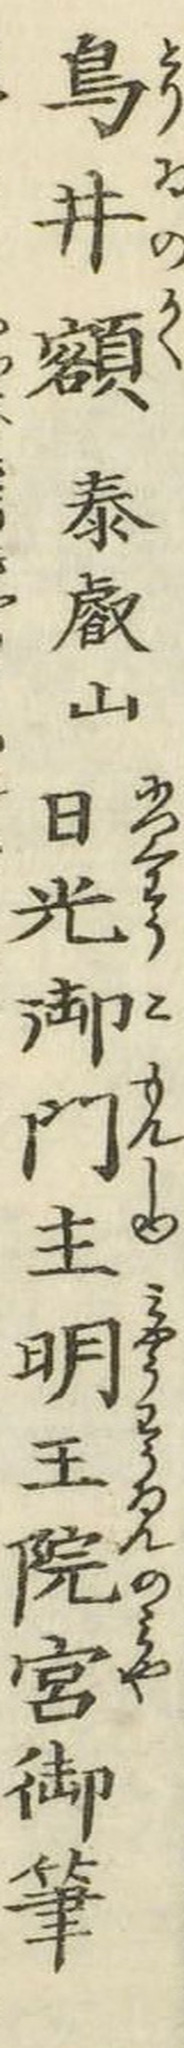鳥井額泰叡山日光御門主明宮院宮御筆
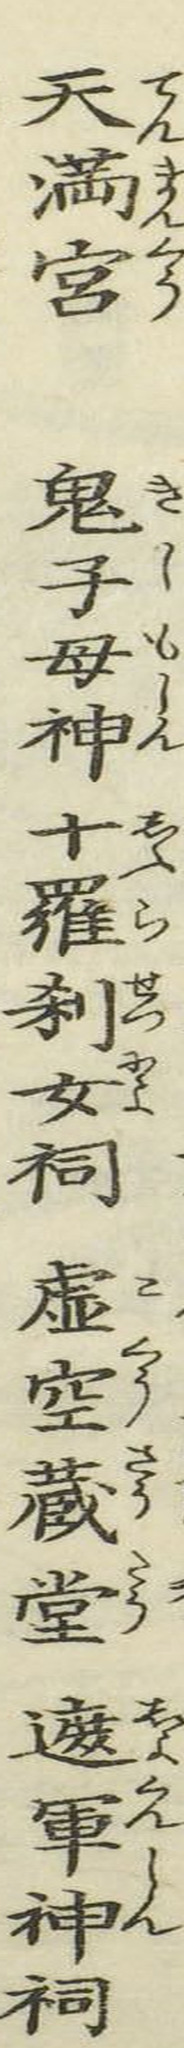天満宮鬼子母神十羅刹女祠虚空蔵堂遮軍神祠
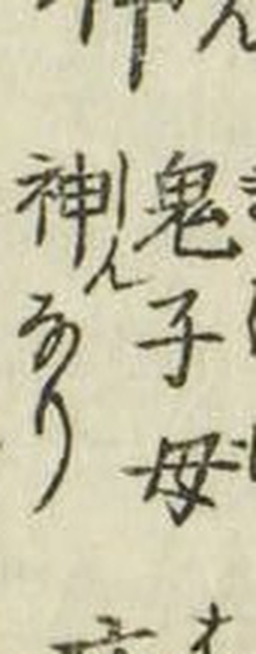いなり

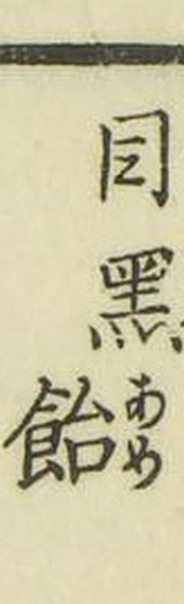目黑飴
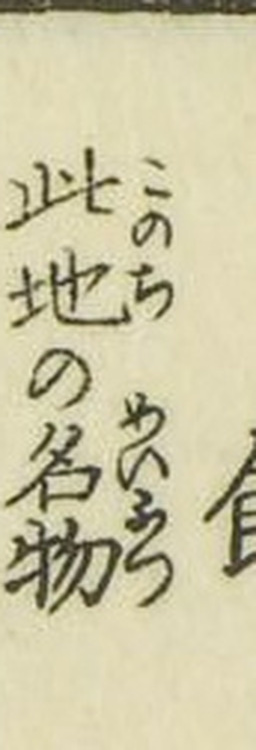此地の名物
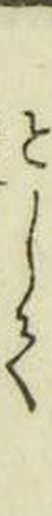として
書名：江戸名所図会 20巻 巻之7
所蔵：東京学芸大学教育コンテンツアーカイブ
